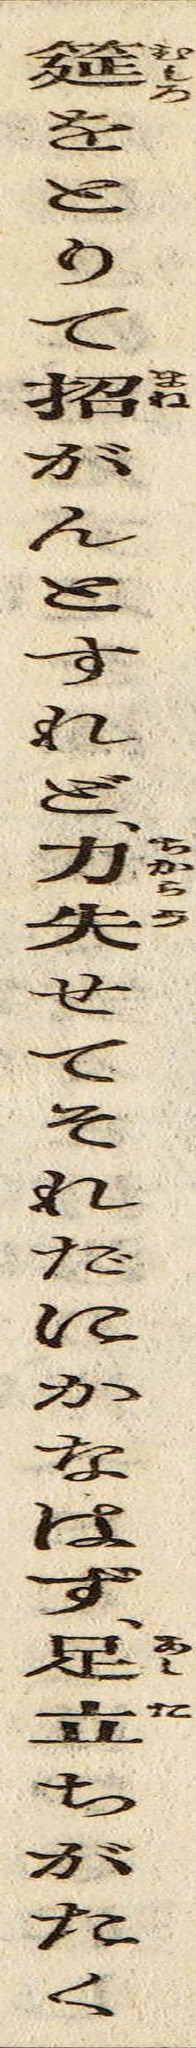筵をとりて招がんとすれど、力失せてそれだにかなはず、足立ちがたく
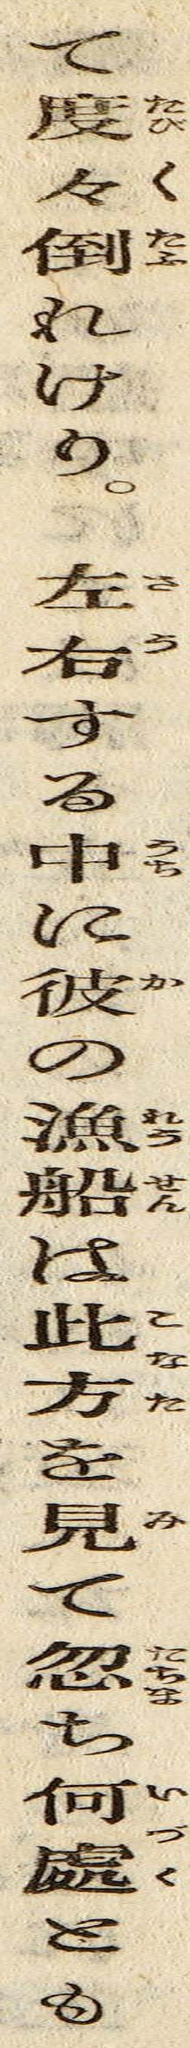て度々倒れけり。左右する中に彼の漁船は此方を見て忽ち何処とも
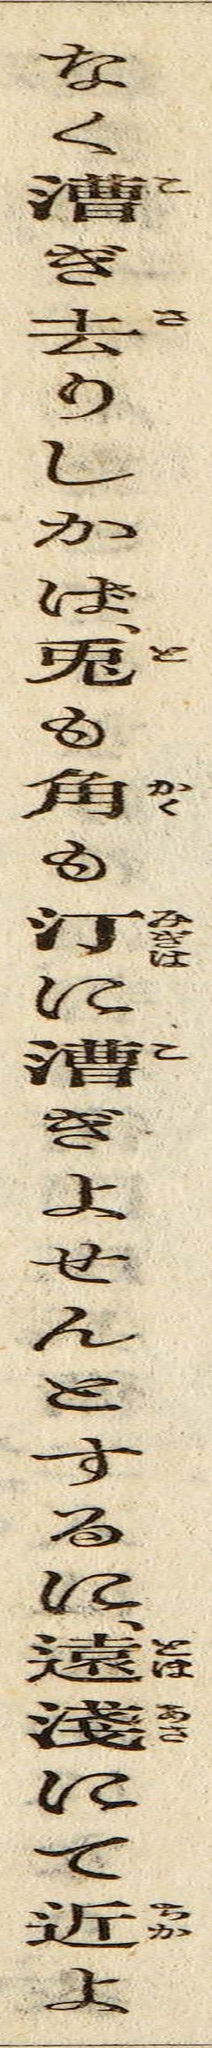なく漕ぎ去りしかば、兎も角も汀に漕ぎよせんとするに、遠浅にて近よ
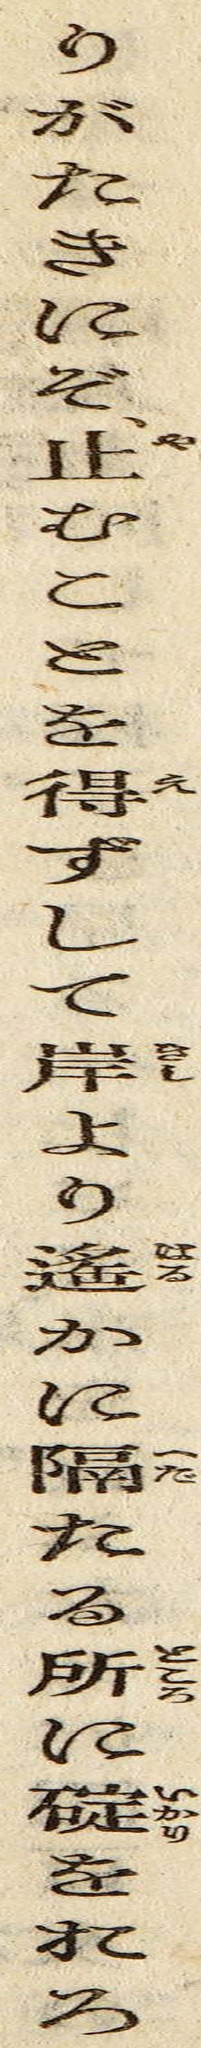りがたきにぞ、止むことを得ずして岸より遥かに隔たる所に碇をおろ

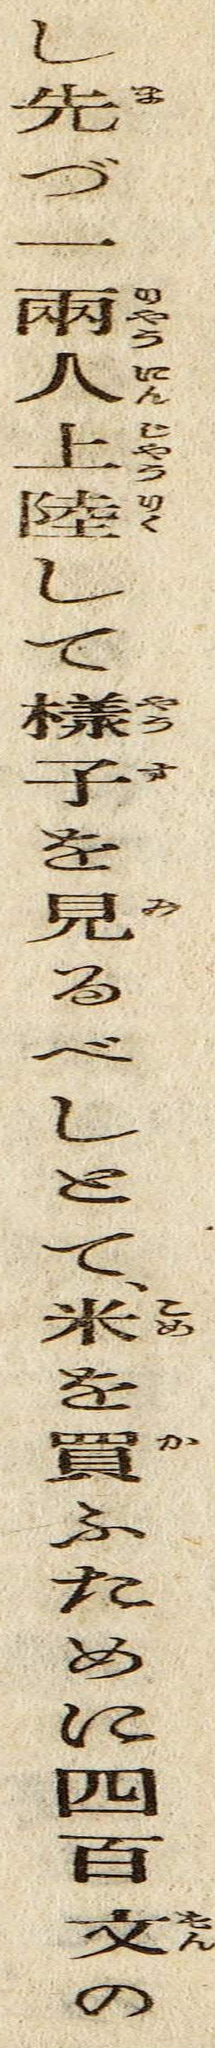し先づ一両人上陸して様子を見るべしとて、米を買ふために四百文の
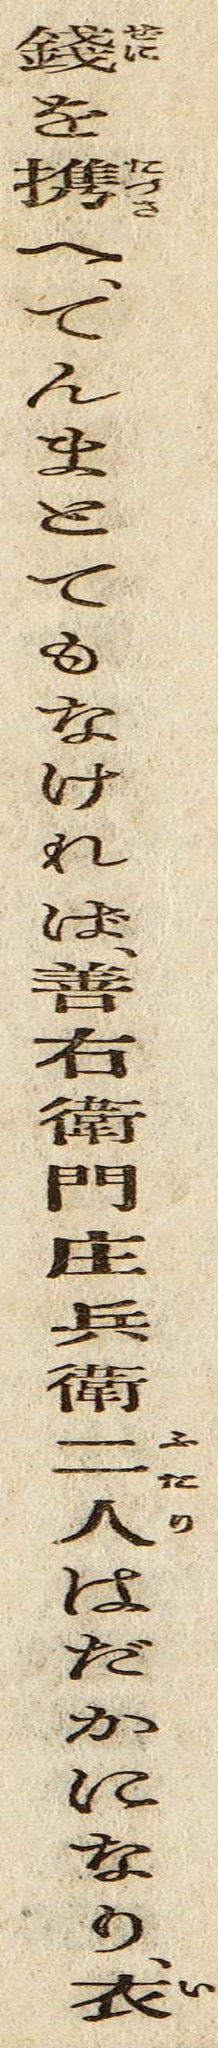銭を携へ、てんまとてもなければ、善右衛門庄兵衛二人はだかになり、衣
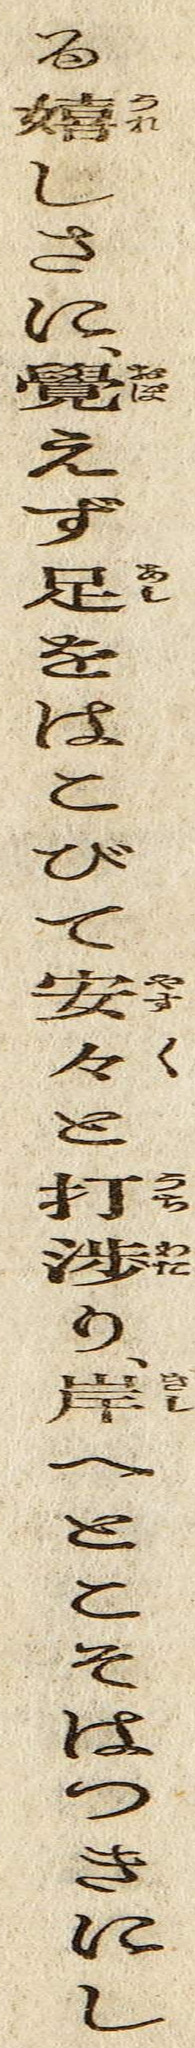る嬉しさに、覚えず足をはこびて安々と打渉り、岸へとこそはつきにし
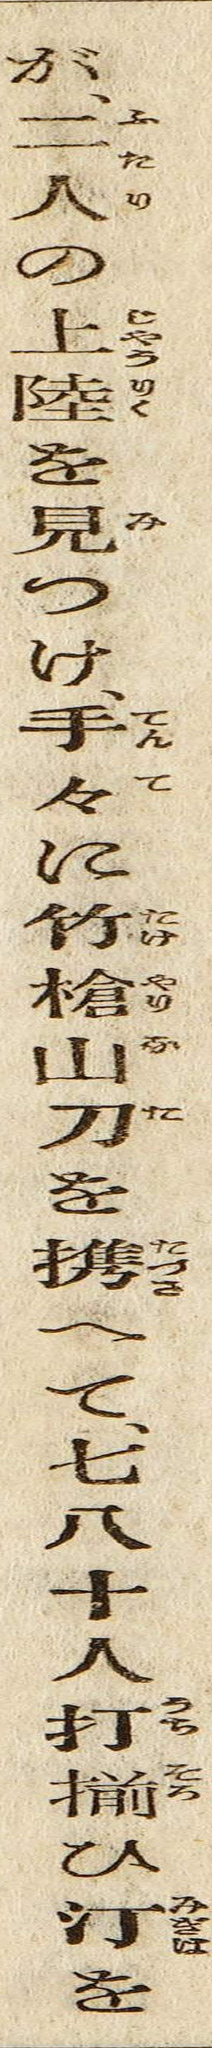が、二人の上陸を見つけ、手々に竹槍山刀を携へて、七八十人打揃ひ汀を
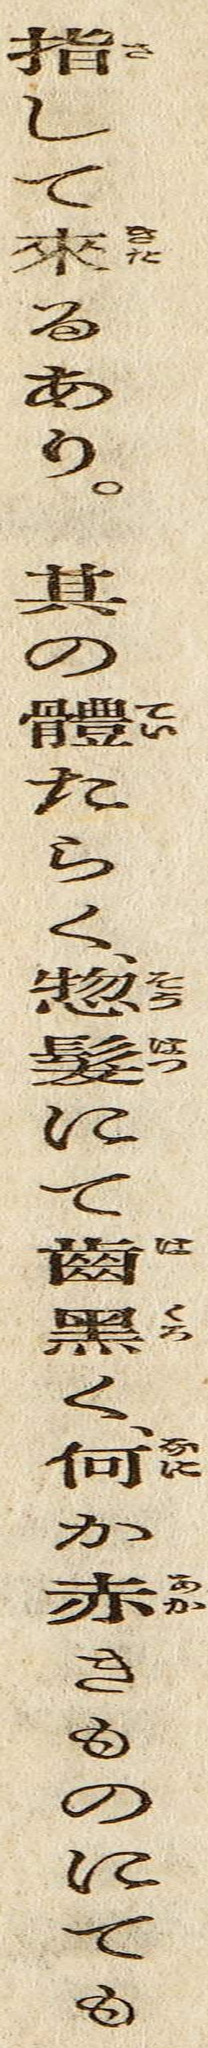指して来るあり。其の体たらく、総髪にて歯黒く、何か赤きものにても
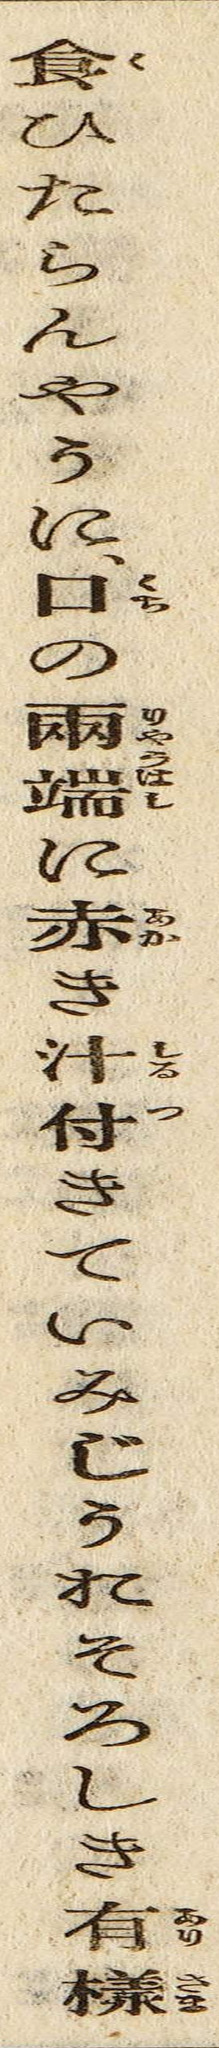食ひたらんやうに、口の両端に赤き汁付きていみじうおそろしき有様
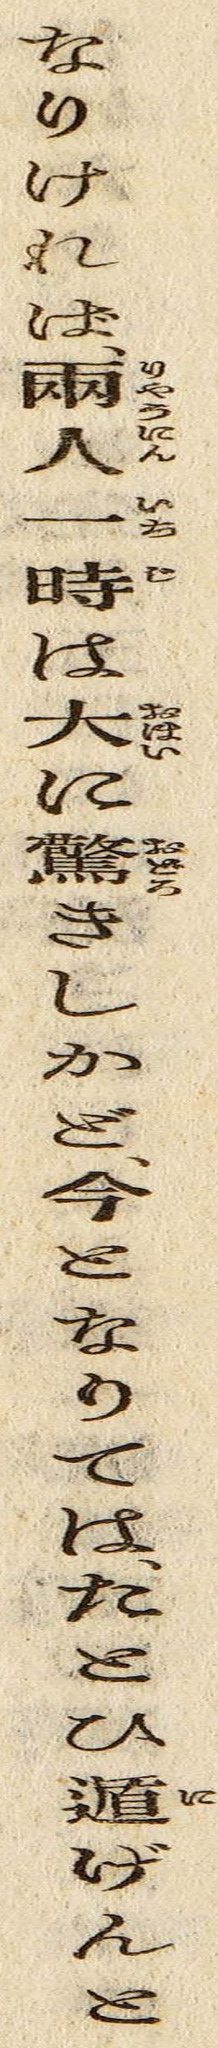なりければ、両人一時は大に驚きしかど、今となりては、たとひ遁げんと
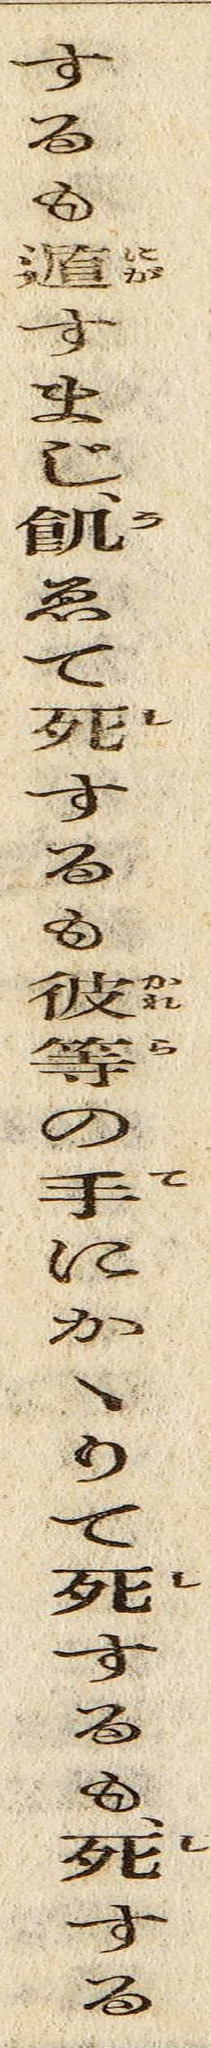するも遁すまじ、飢ゑて死するも彼等の手にかヽりて死するも、死する
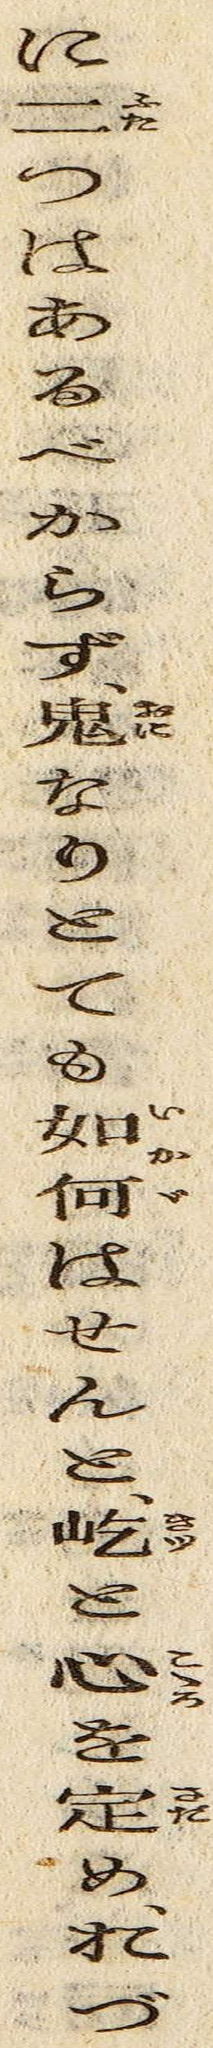に二つはあるべからず、鬼なりとても如何はせんと、屹と心を定め、おづ
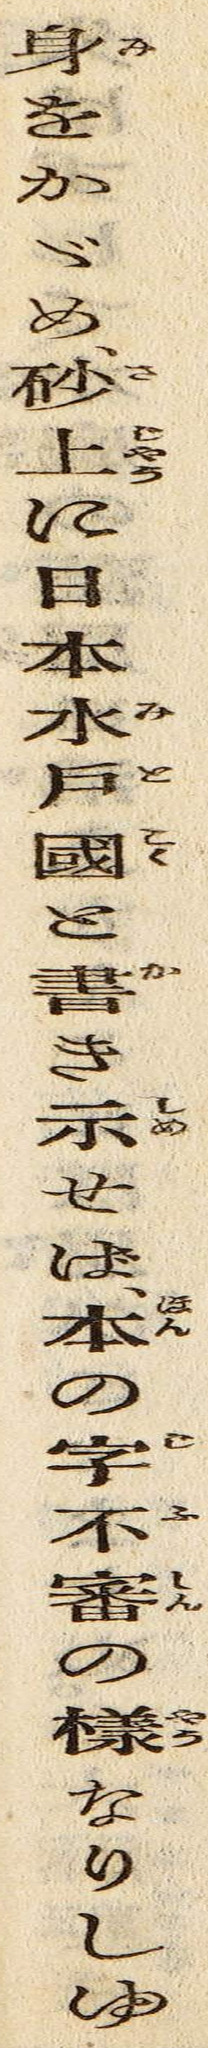身をかゞめ、砂上に日本水戸国と書き示せば、本の字不審の様なりしゆ
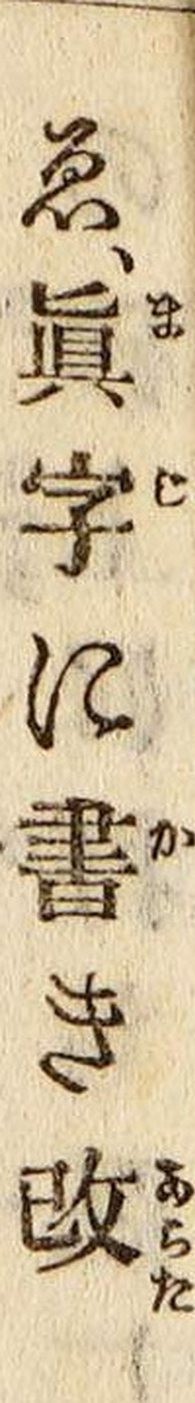ゑ、真字に書き改
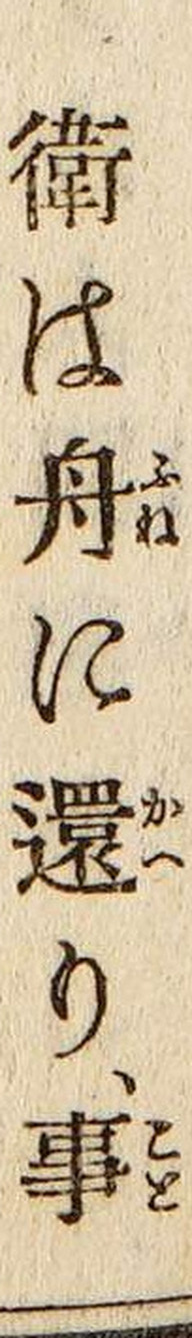衛は舟に還り、事
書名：日本漂流譚
